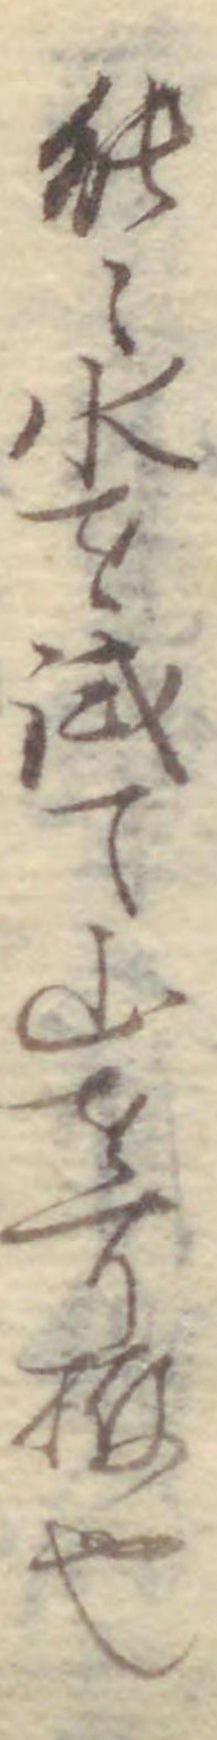能々水を試て山を可拵也
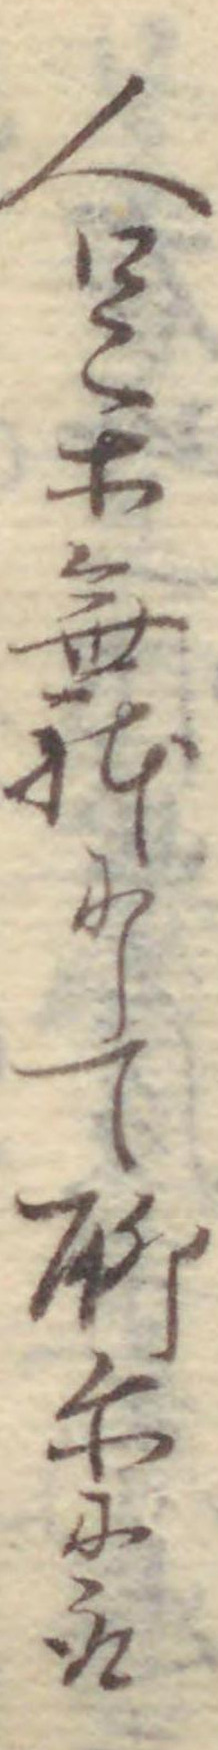人足等無体にして聊爾に取
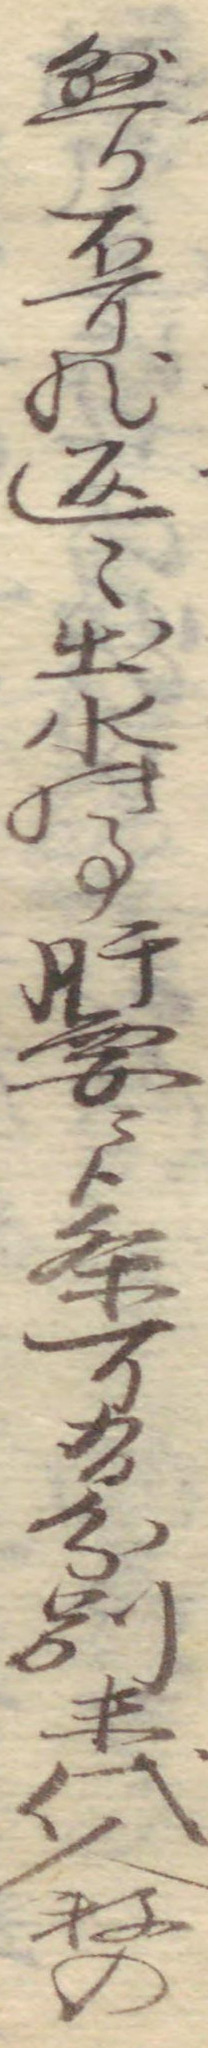懸り不可然返々出水の事肝要二候条可有分別末代人数の
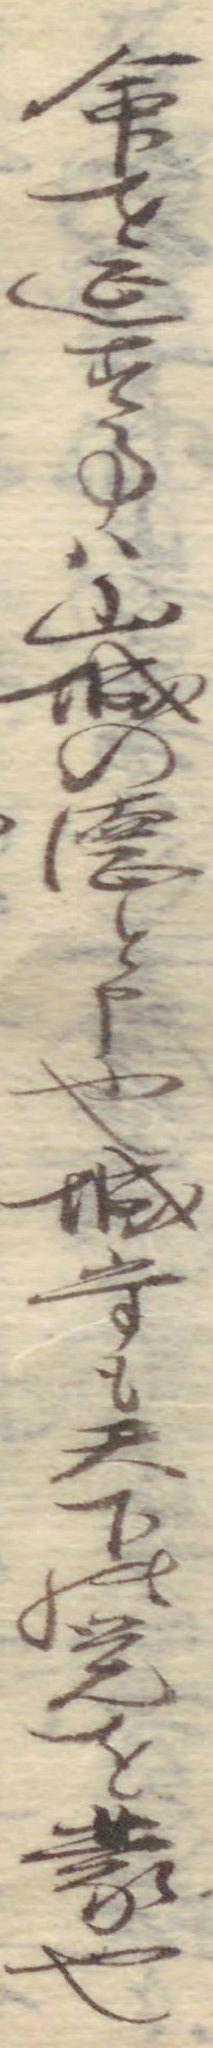命を延す事ハ山城の徳と申也城守も天下の覚を蒙也
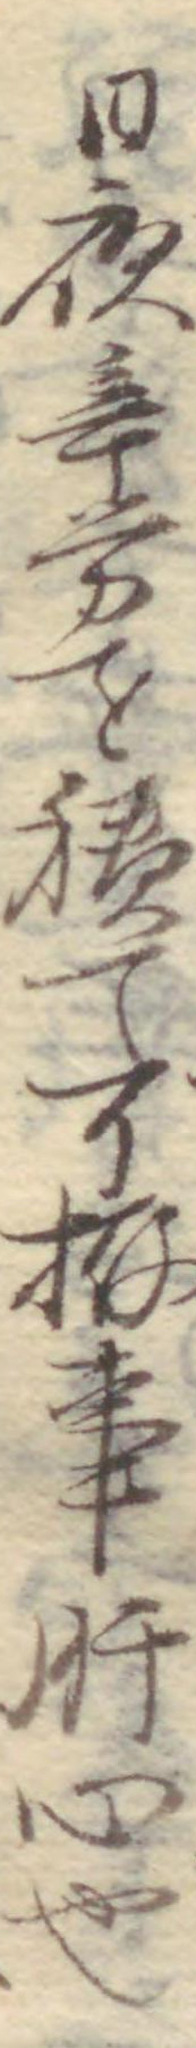日夜辛労を積て可拵事肝心也
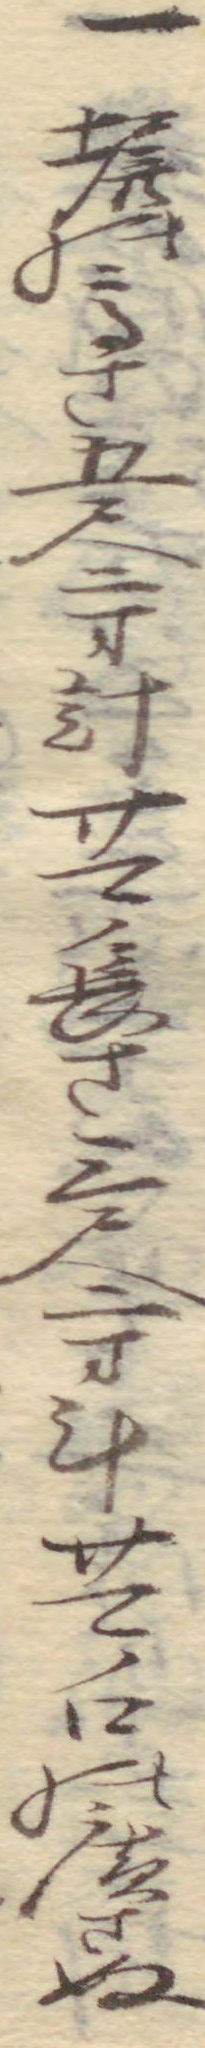一堀の高さ五尺二寸計サマノ長さ三尺二寸斗サマノ口の広さぬ
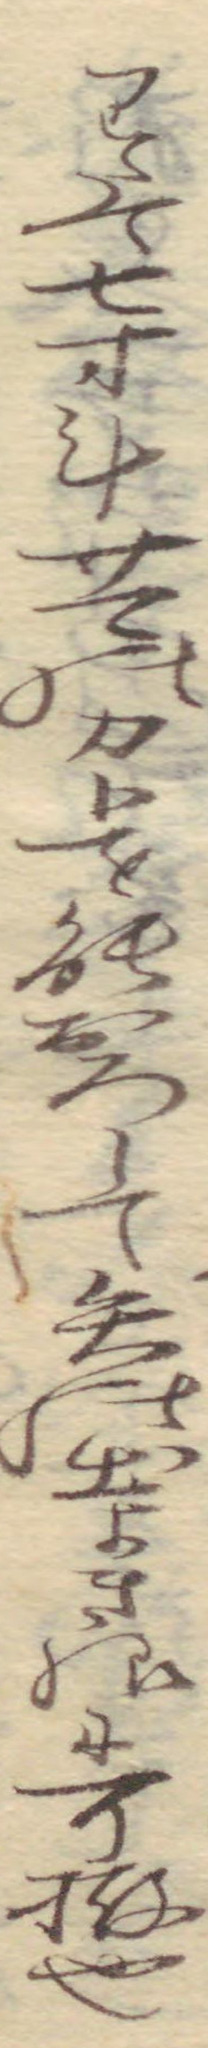りたて七寸斗サマのカトを能おろして矢の出よき様に可拵也
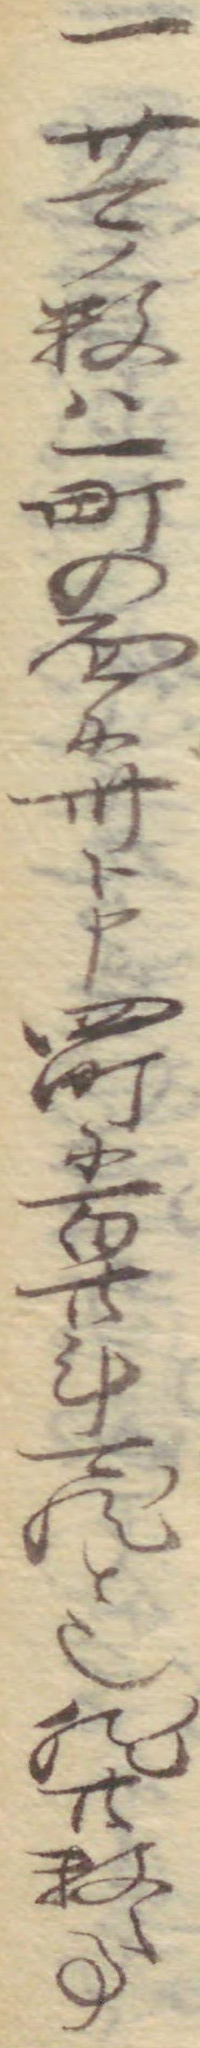一サマノ数は一町の西に三十ト申四町に百廿斗可然と也然共数之事
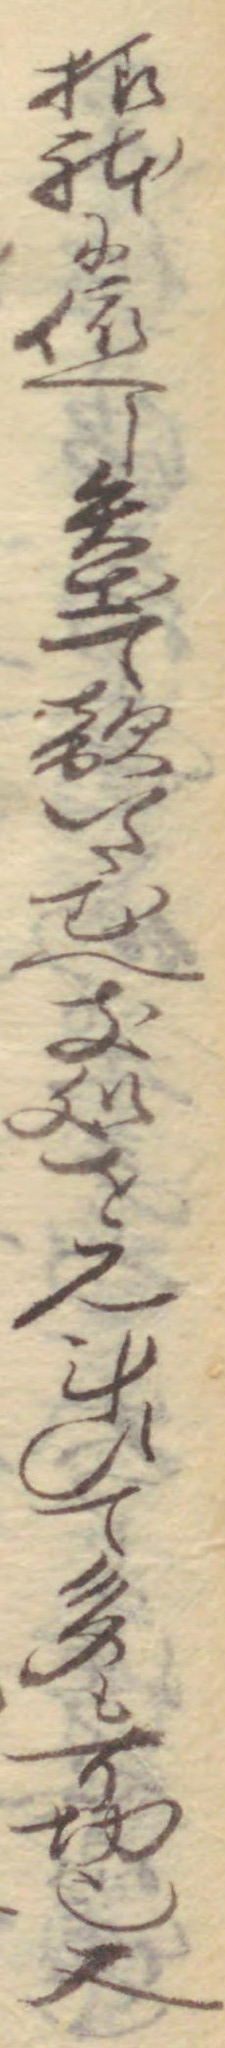様体に依へし矢出て敵いたむへき処を見斗ひて多も可切也又
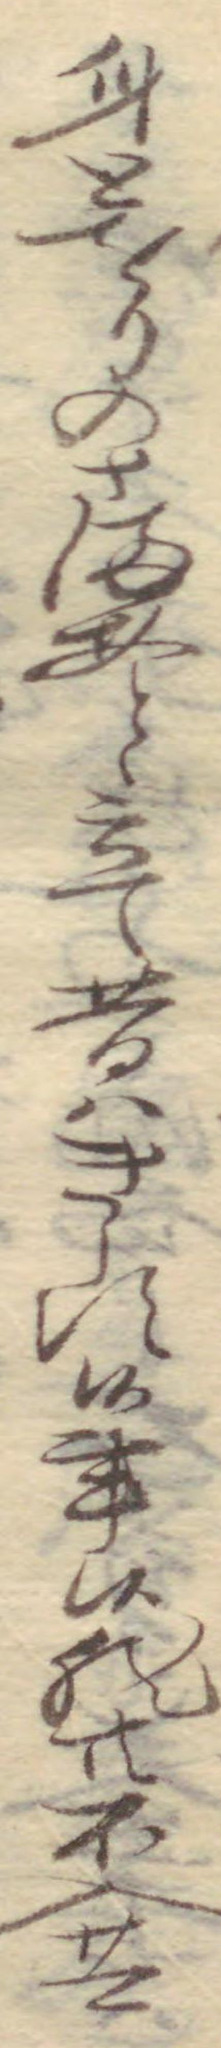身とをりのさまなとゝ云て昔ハきらす候事候然共不入サマ
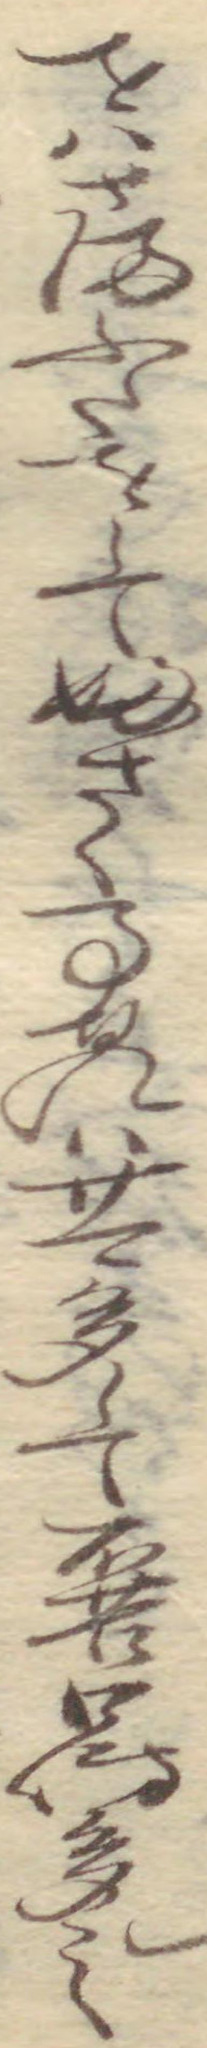をハさまふたをしてふさく事なれハサマ多して不苦口伝多之
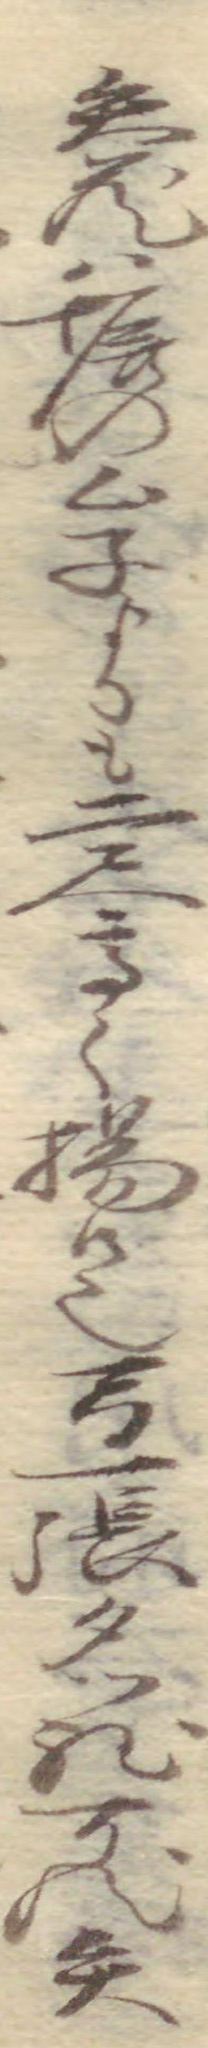一矢蔵は堀のムねよりも二尺高く揚る也弓一張タツ程可然矢
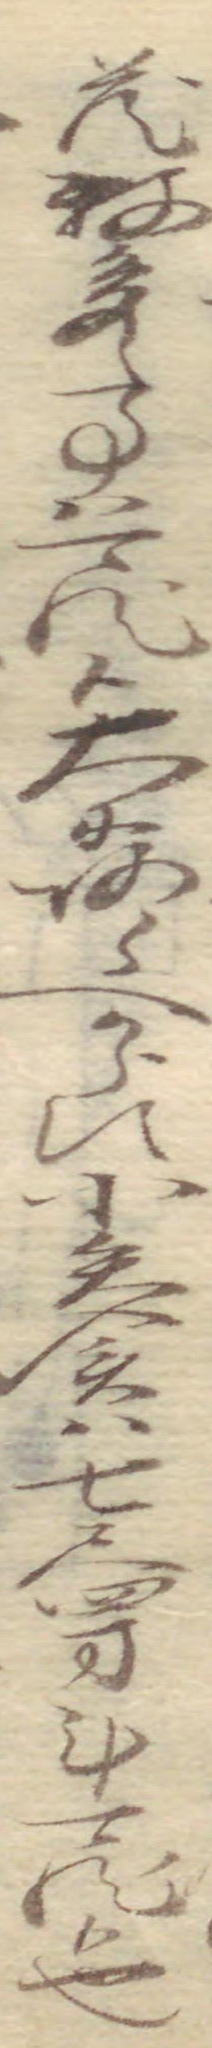蔵数多候事ハ可然候大にあけへからす小矢倉ハ七尺四寸斗可然候也
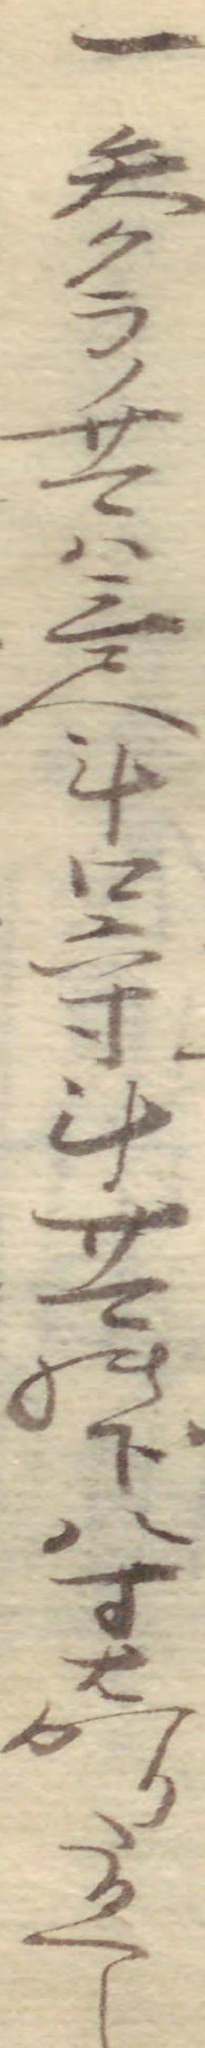一矢クラノサマハ三尺斗口六寸斗サマの下八寸はかりたるへし
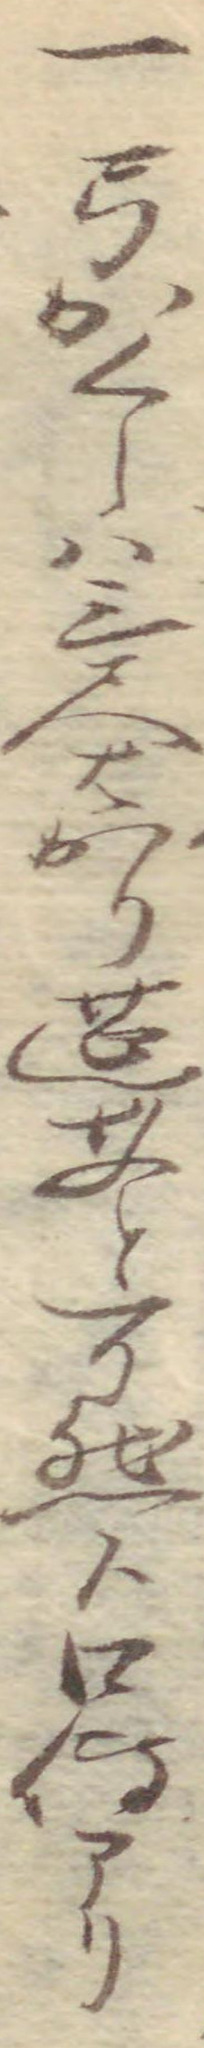一弓かくしハ三尺はかり莚なと可然候口伝アリ
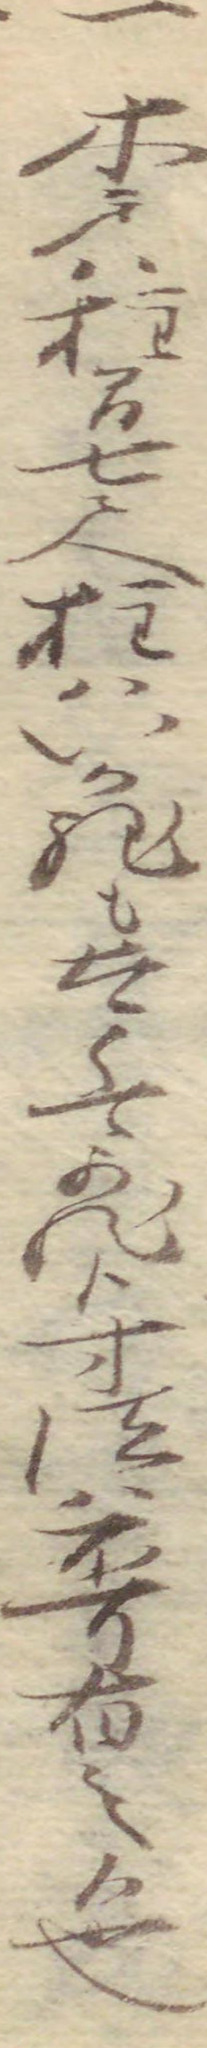一木戸ハ柱間七尺柱ハいか程も太くて可然候寸法ハ不可有之候也
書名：鶯宿雑記. 巻199-200
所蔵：国立国会図書館 National Diet Library, JAPAN
